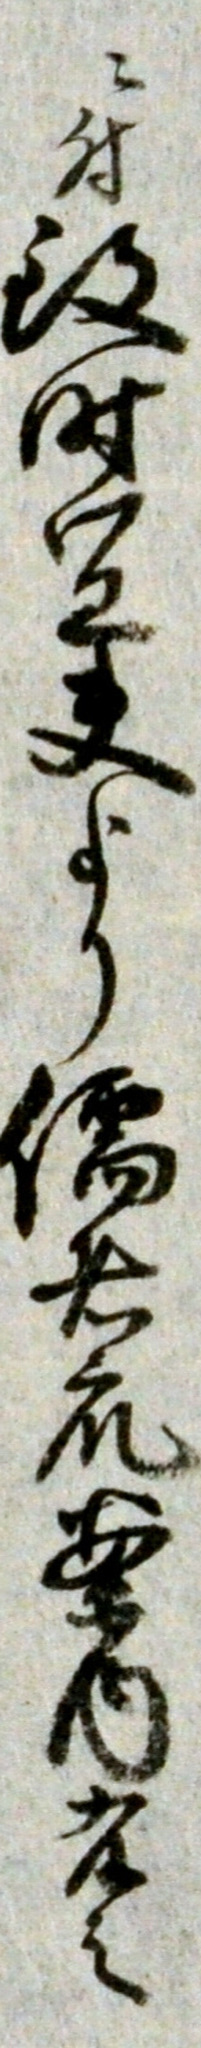ニ付致時宜夫より儒者衆案内有之
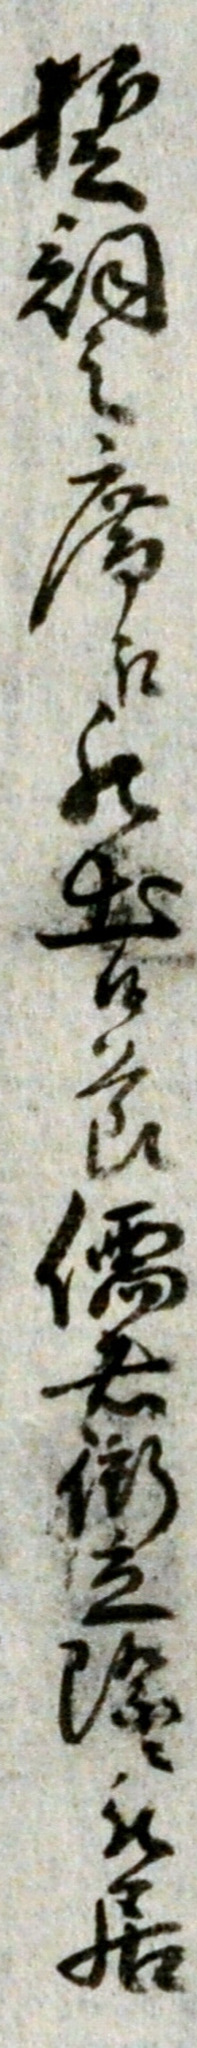誓詞之席江罷出候節儒者衝立際ニ被居
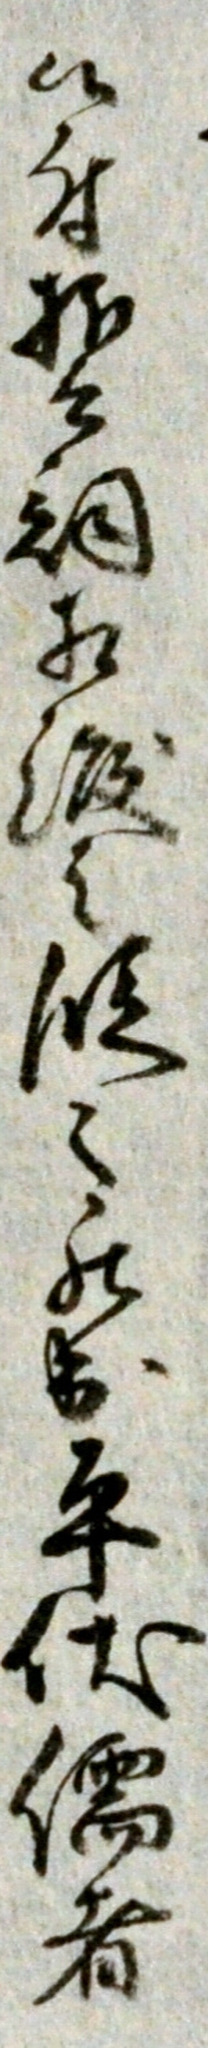候付誓詞相渡者段々罷出平伏儒者
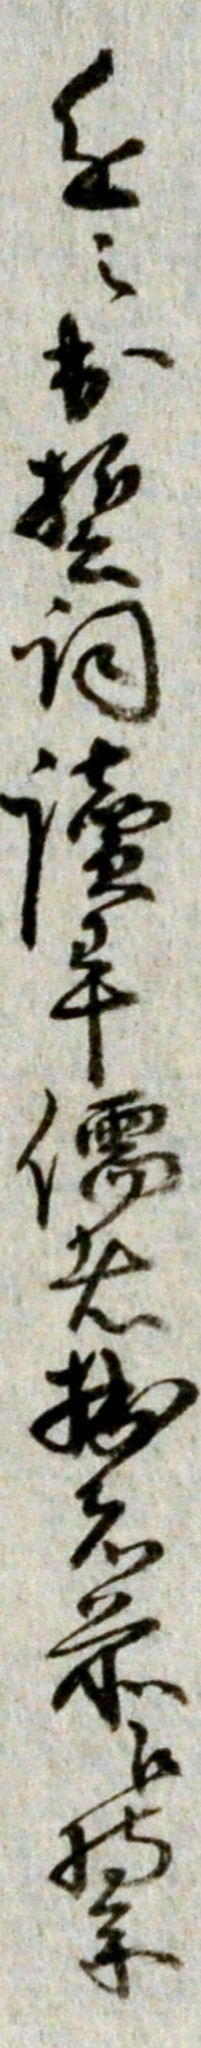進ミ出誓詞讀卆儒者拙者前江持参
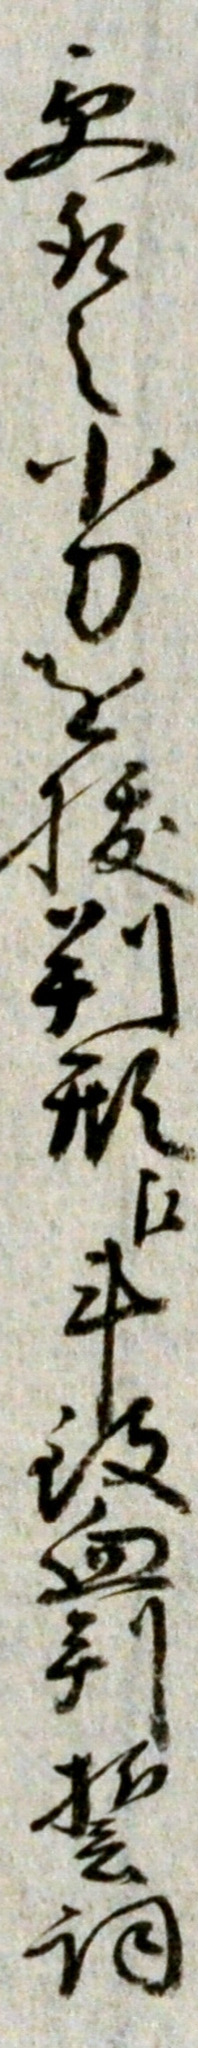受取し小刀を抜判形江斗致血判誓詞
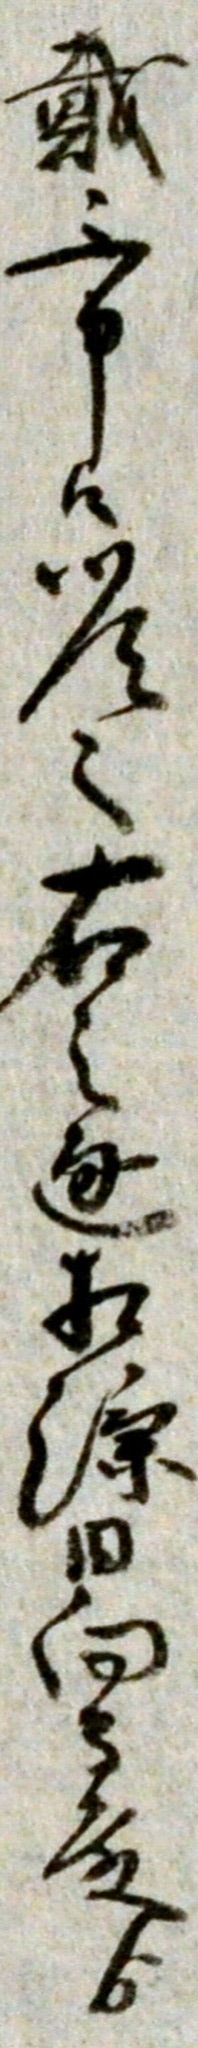戴不申候順々右之通相済日向守殿ゟ
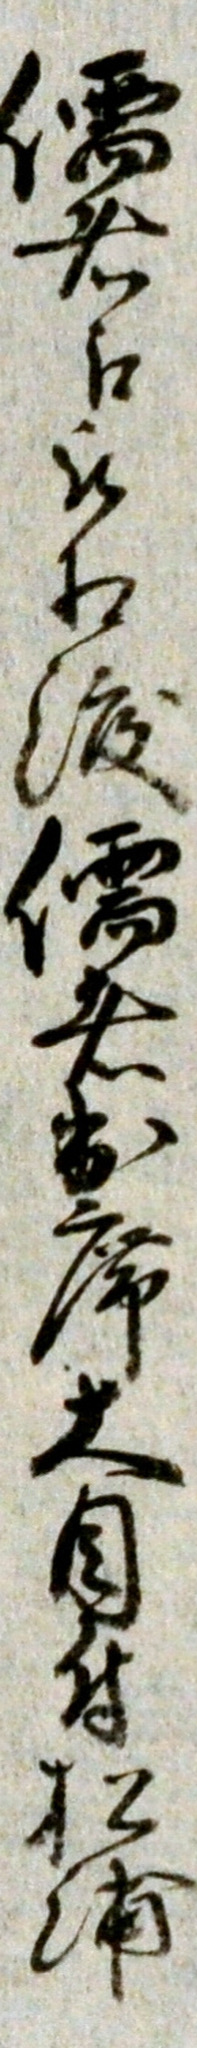儒者江被相渡儒者出席大目付松浦
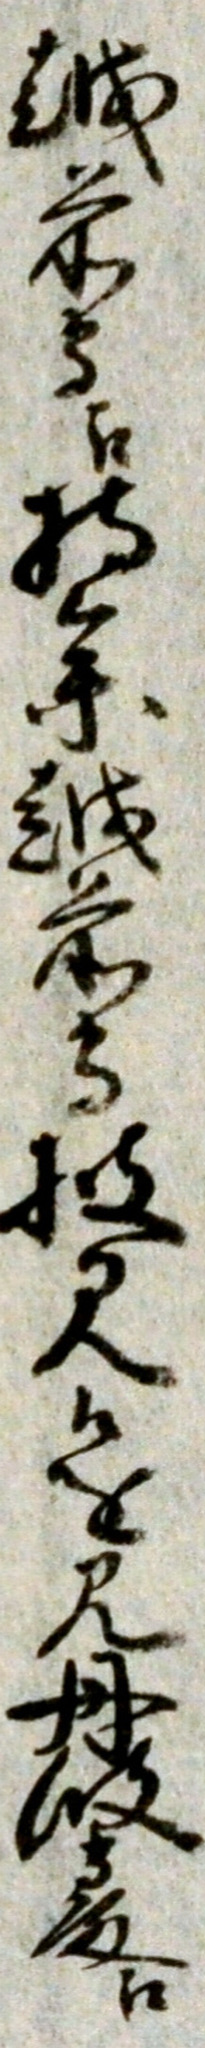越前守江持参越前守披見候を見丹波守殿江
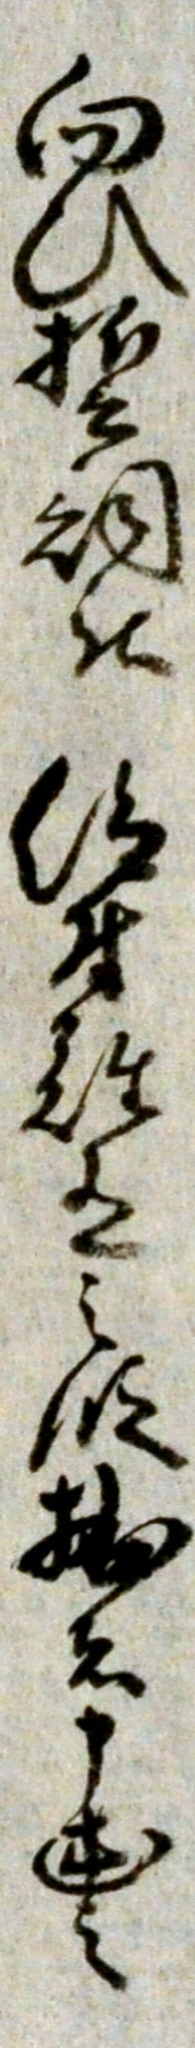向ひ誓詞被仰付難有之段拙者申述之
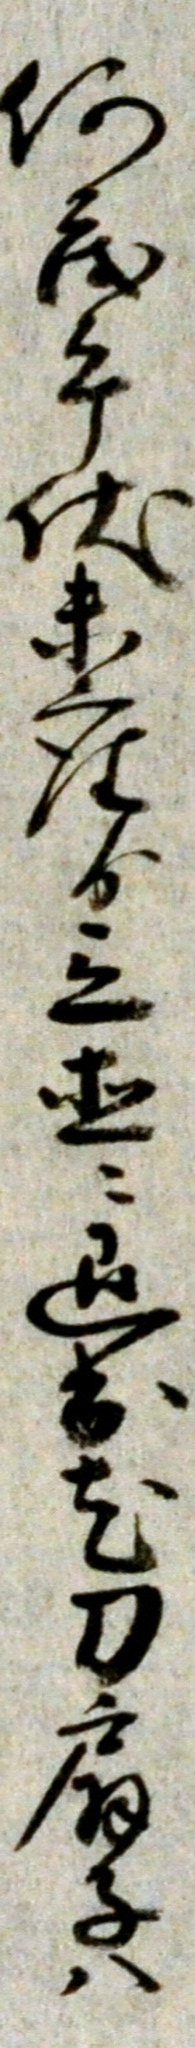何茂平伏末座ゟ立直ニ退出尤刀肩子ハ
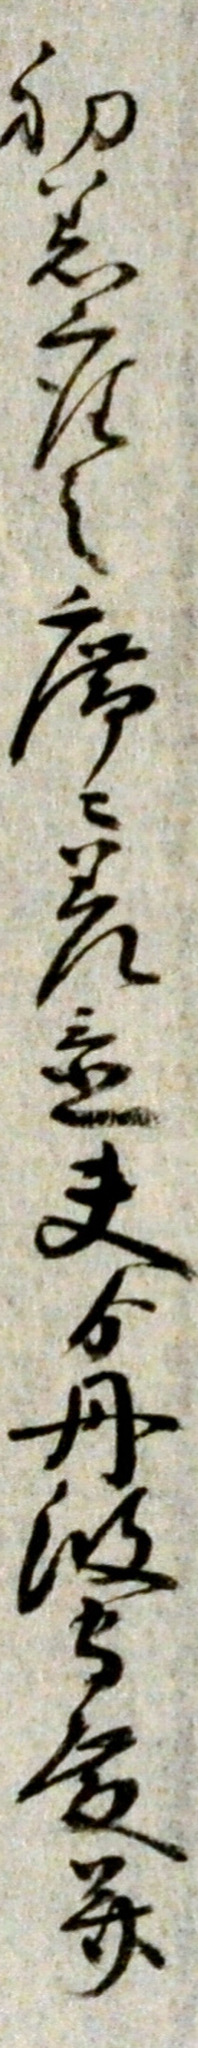初着座之席ニ差置夫ゟ丹波守殿幷
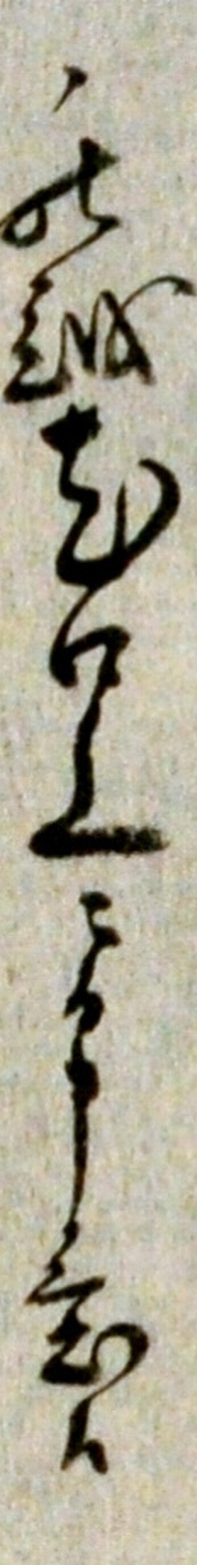罷越尤口上二而申置候
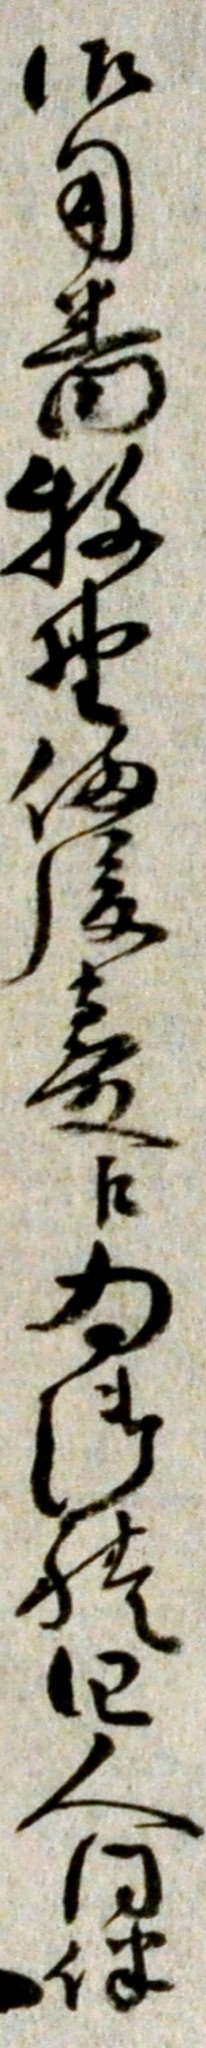御用番牧野備前守殿江為御禮四人同伴
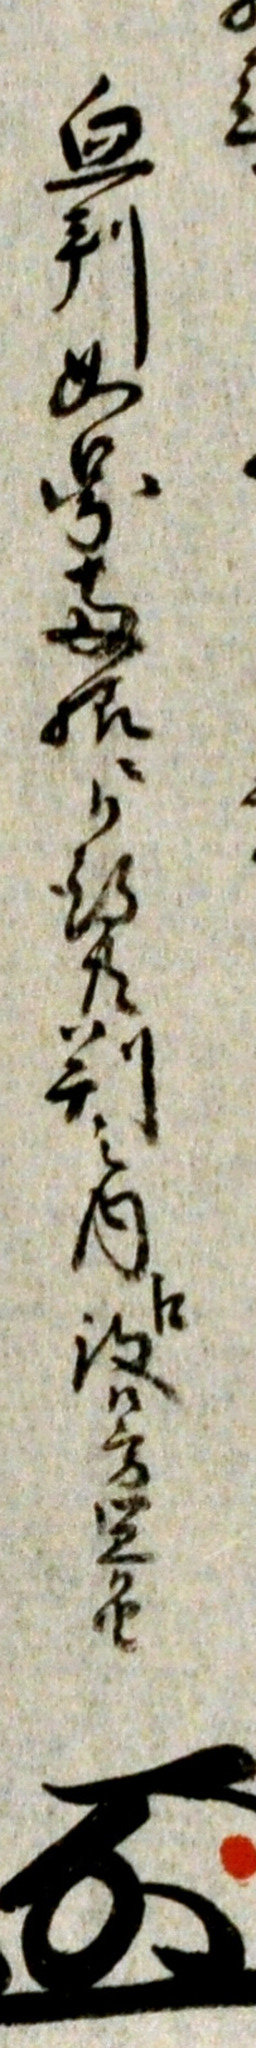血判如図両様ニ候得共判之内江致候方宜候由
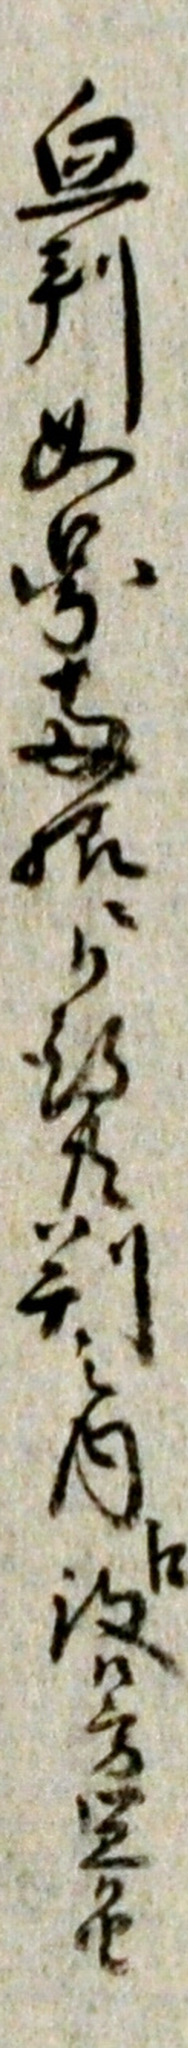血判如図両様ニ候得共判之内江致候方宜候由
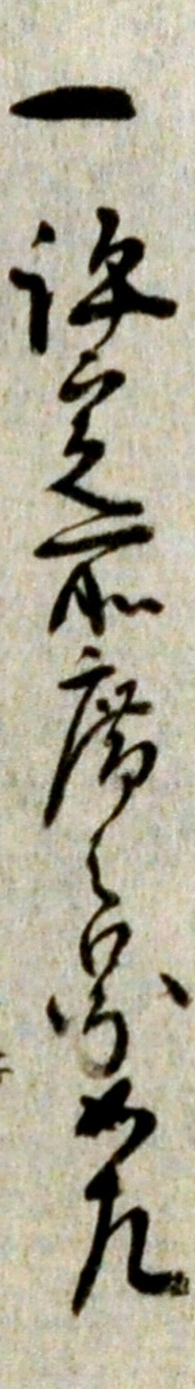一評定所席の図如左
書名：大阪加番関係諸書留〔一括〕
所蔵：伊那市立高遠町図書館・合同会社AMANE
